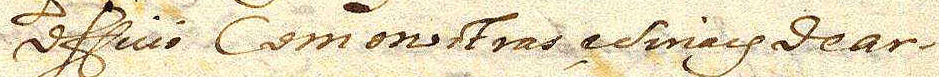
Officio Com mostras e sinaes de ar
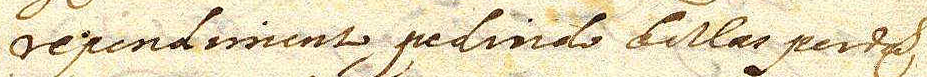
rependimento, pedindo dellas perdaõ
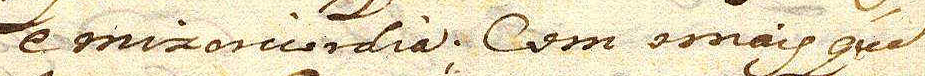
e mizericordia; Com o mais que
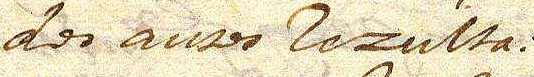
dos autos Rezulta:
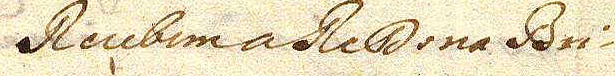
Reçebem a Re Dona Bri
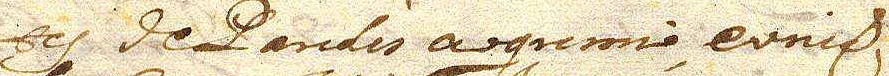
tes de Paredes ao gremio, e vniaõ
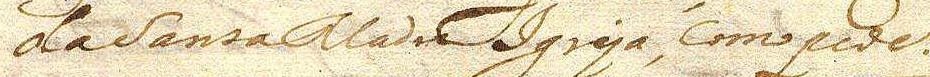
da Santa Madre Igreja, como pede.
